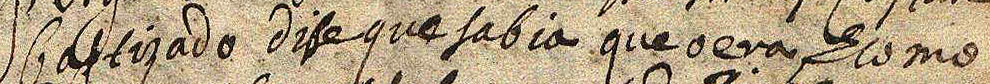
baptizado disse que sabia que o era, E como
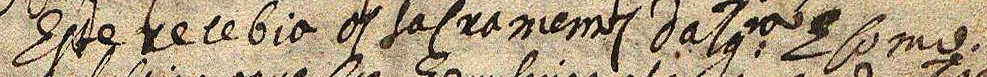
Este recebia os saCramentos da Igra. E Como
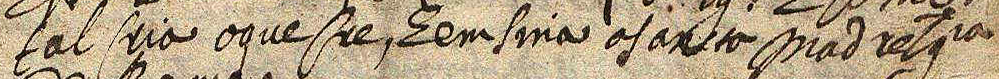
tal Cria o que Cre, E emsina a sancta madre Igia
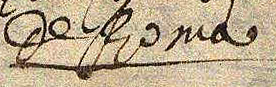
de Roma
